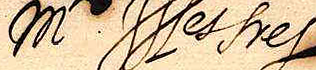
mto Jlles sres
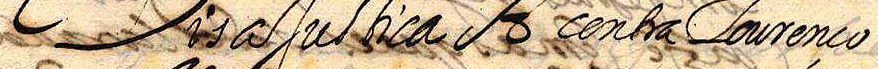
Dis a Justica A contra Lourenço
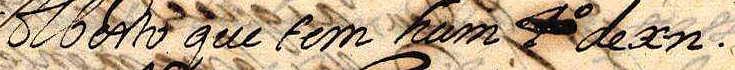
Alberto que tem hum 4º de x.n.
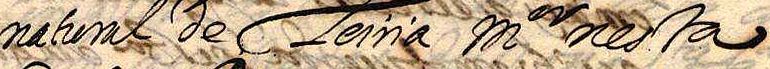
natural de Leiria mor nesta
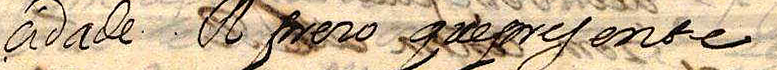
cidade R prezo que presente
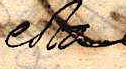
esta
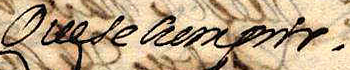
Que se cumprir
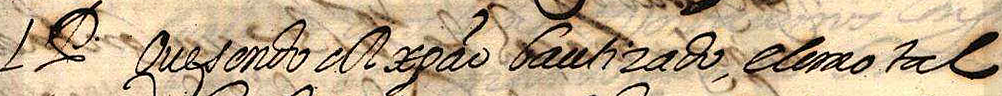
1 P. Que sendo o R xpão bautizado, e como tal
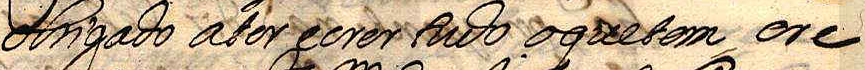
obrigado a ter e crer tudo o que tem, cre
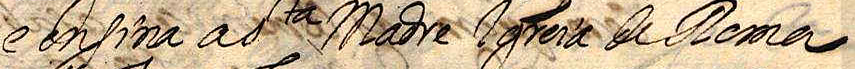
e ensina a sta Madre Igreia de Roma
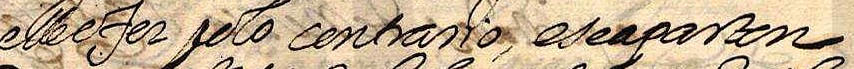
elle o fez pelo contrario, e se apartou
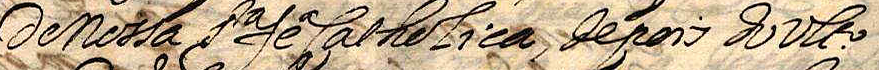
de nossa sta fêe Catholica, depois do vlt.o
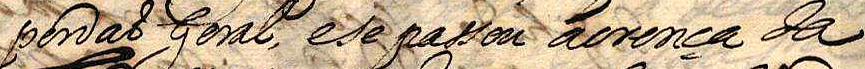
perdaõ Geral, e se passou a crença da
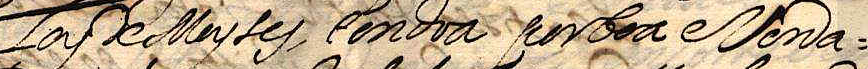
Ley de Moyses, tendoa por boa e Verda
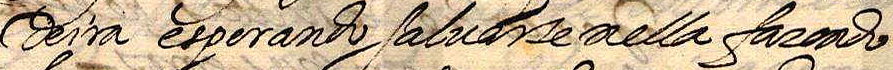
deira esperando saluarse nella fazendo
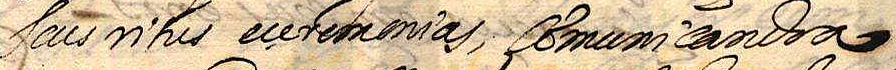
seus ritus e çeremonias, cōmunicandoa
